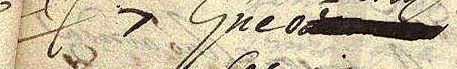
ꝓ 7 Que o _
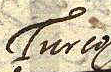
Turco
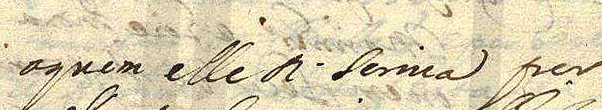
a quem elle R. seruia per
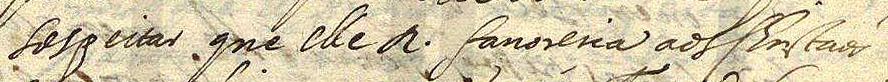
sospeitar que elle R. fauoresia aos Christaõs
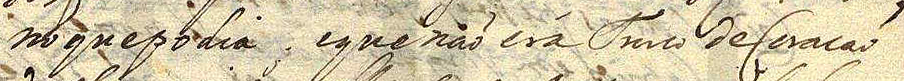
no que podia, e que naõ era Turco de Coraçaõ
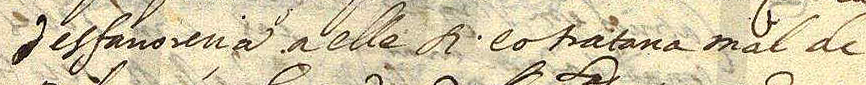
desfauoresia a elle R. e o trataua mal de
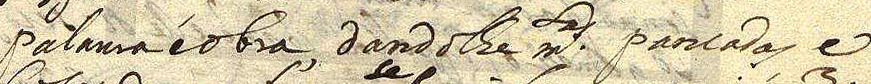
palaura e obra, dandolhe mtas. pancadas e
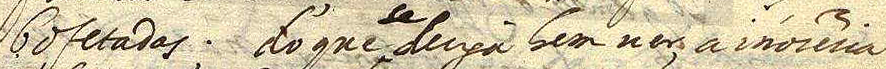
bofetadas; do que, se deuja bem uer a inocēcia
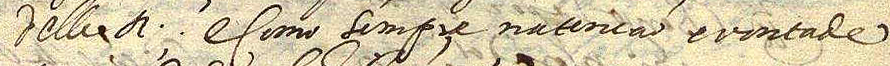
delle R., e Como sempre na tencaõ e vontade
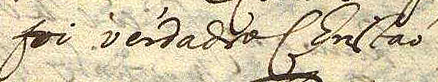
foi verdadro Christaõ
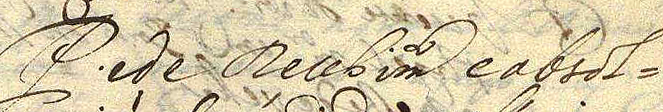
Pede Recebimto e absol
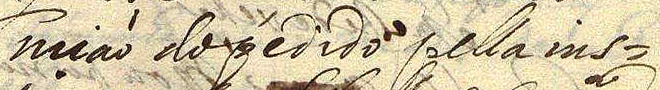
uiçaõ do pedido pella ius
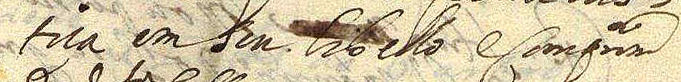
tiça em seu libello e Comprimto
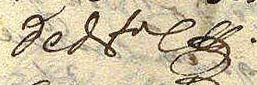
de Ista ett̄.
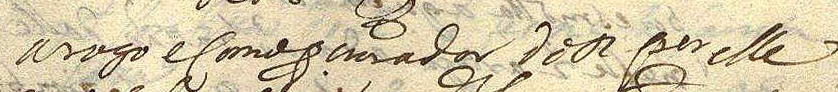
a rogo e Como ꝓcurador do R per elle
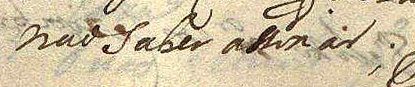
nao saber assinar;
